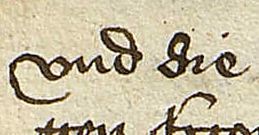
vnd die
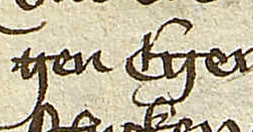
gen Eger
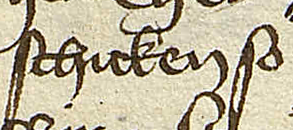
ſchicken ſo
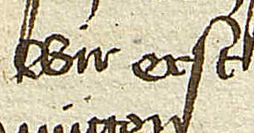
wir erſt
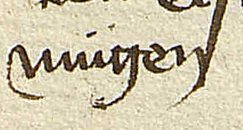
mügen
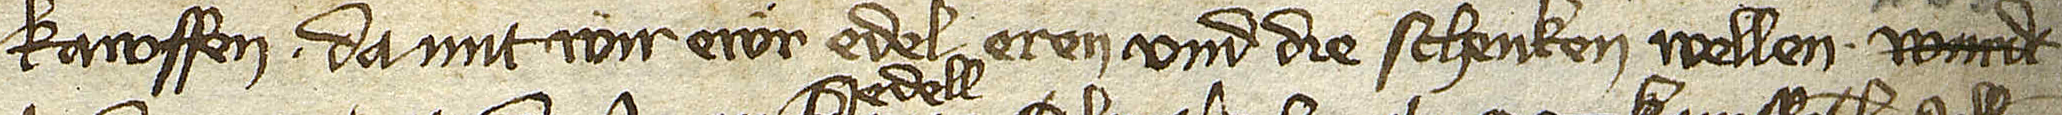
kawffen . da mit wir ewr edel eren vnd die ſchenken wellen . wurdt
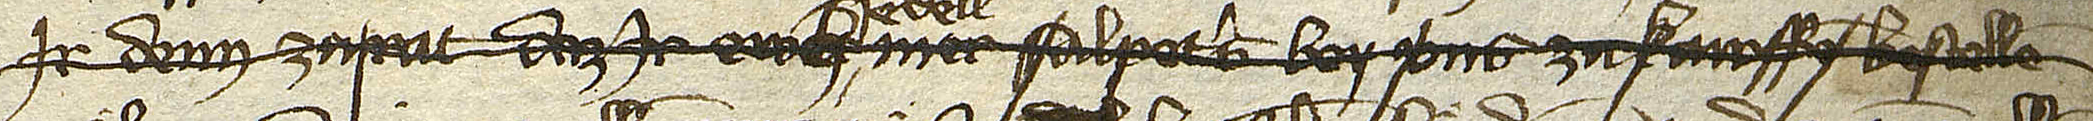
Ir denn ʒurat daʒ Ir ewr* mer ſalpet*s bey vns ʒu kawffe* beſtelle*
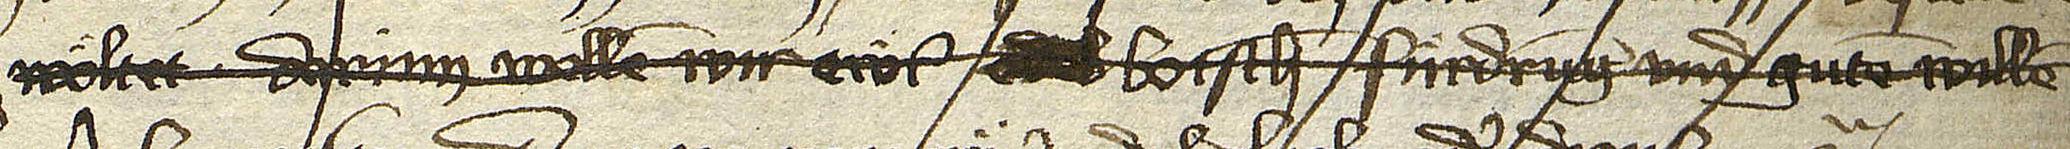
wöltet . darinn welle* wir ew*r edel botſch* fürdru*g vnd gute* wille*
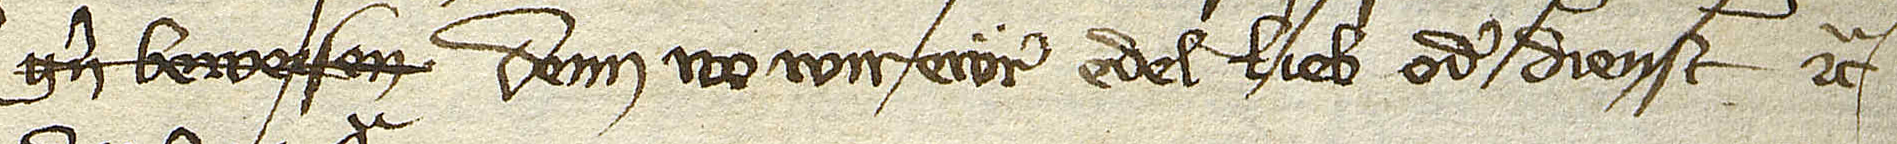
g*n beweiſen Denn wo wir ew*r edel lieb od* dienſt ec*
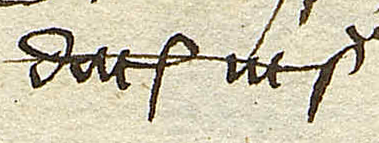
dat* ut ſ*
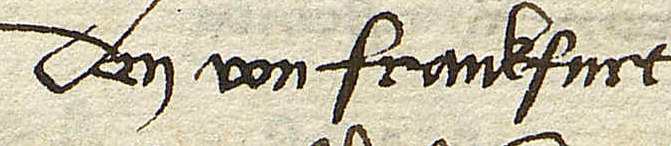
Den von frankfurt
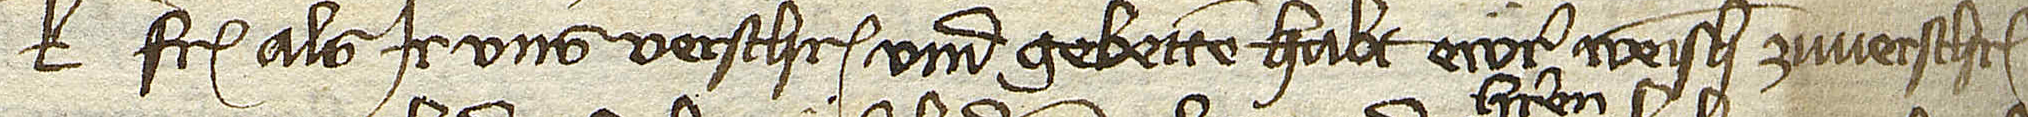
L* fr* als Ir vns verſchr* vnd gebette* habt ew*r weiſh* ʒuuerſchr*
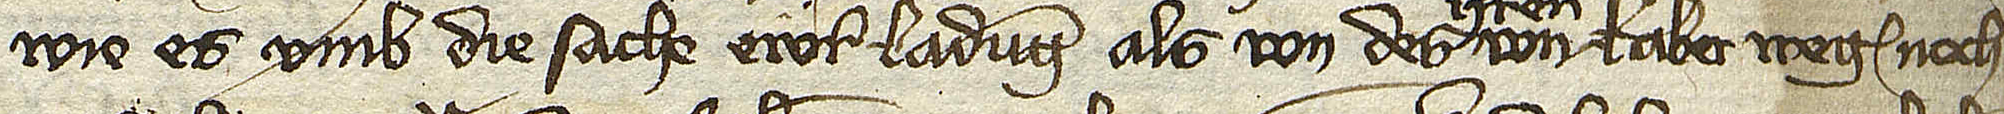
wie es vmb die ſache ew*r ladu*g als von des von laber weg* noch
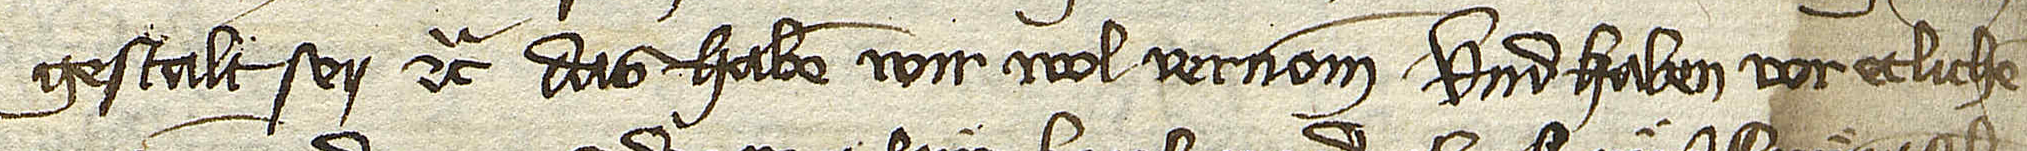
geſtalt ſey ec* das habe* wir wol vernom* / Vnd haben vor etliche*
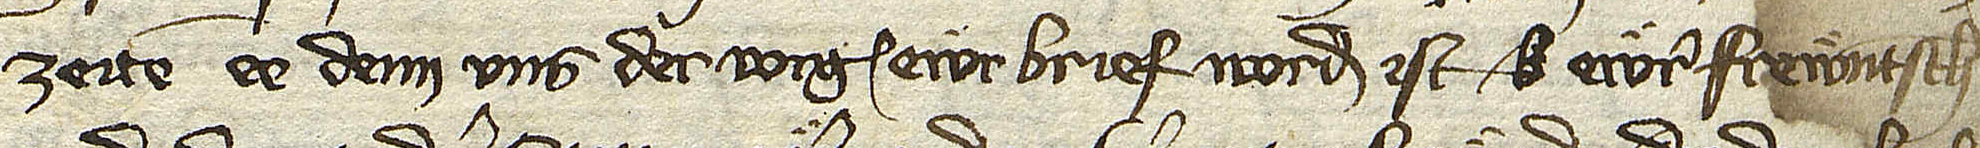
ʒeite* ee denn vns der vorg* ewr brief word* iſt / b ewr frewntſch*
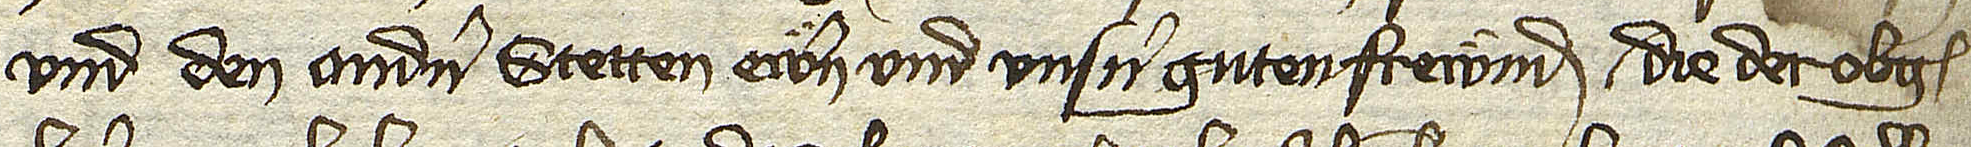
vnd den and*n Stetten ew*n vnd vnſ*n guten frewnd* / die der obg*
